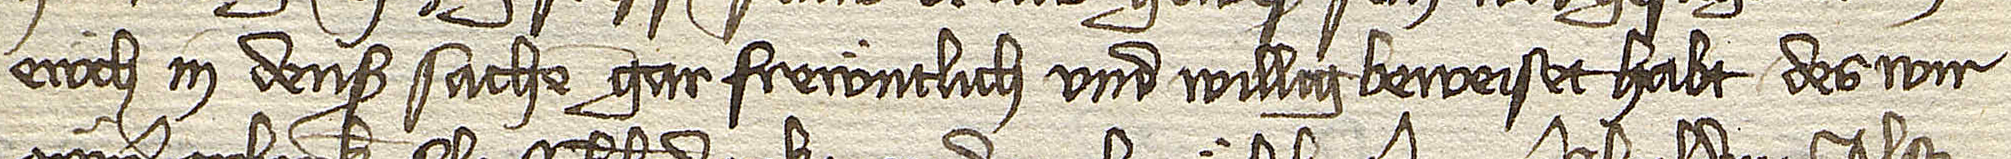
eẅch in denſ* ſache* gar freẅntlich vnd willig beweiſet habt / des wir
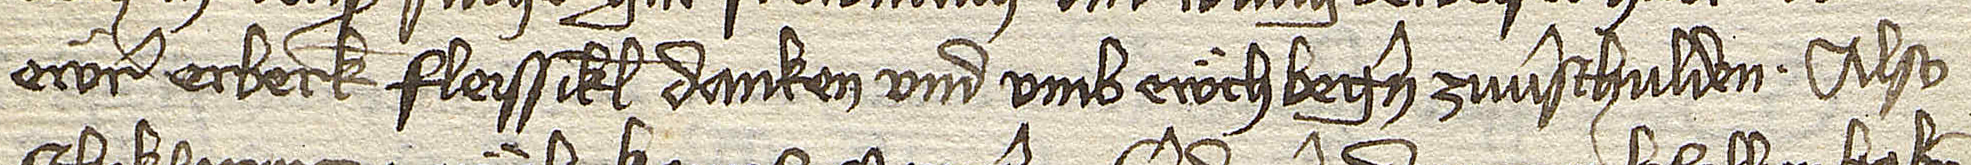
eẅr* erberk* fleiſſikl* danken vnd vmb eẅch beg*n ʒuu*ſchulden . Alſo
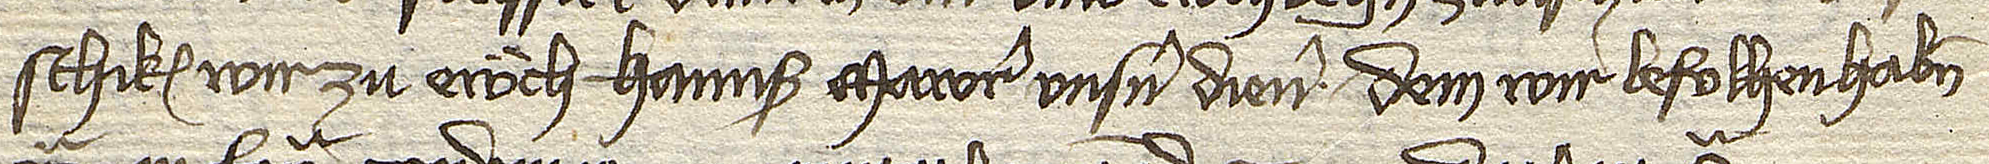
ſchik* wir ʒu eẅch hannſ* Mawr* vnſn* dien* . / Dem wir befolhen habn*
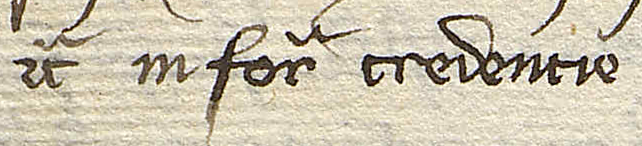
ec* in for* credencie
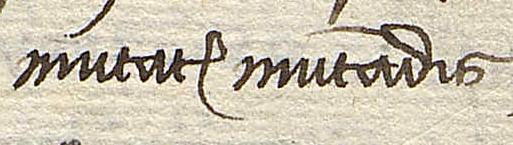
mutat* muta*dis
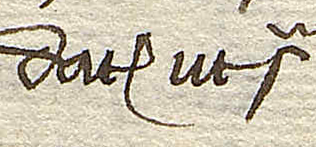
dat* ut ſ*
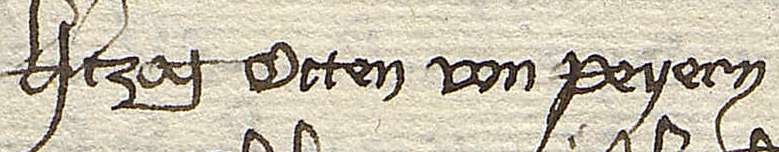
H*cʒog Otten von Peyern
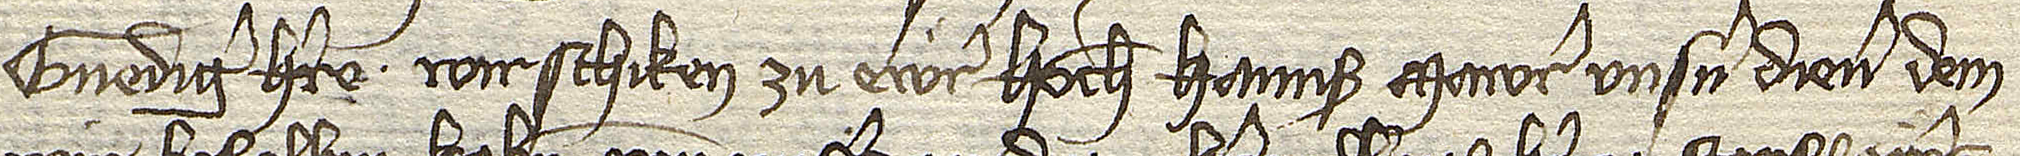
Gnedig* h*re . wir ſchiken ʒu eẅr* Hoch* Hannſ* Mawr* vnſn* dien* dem
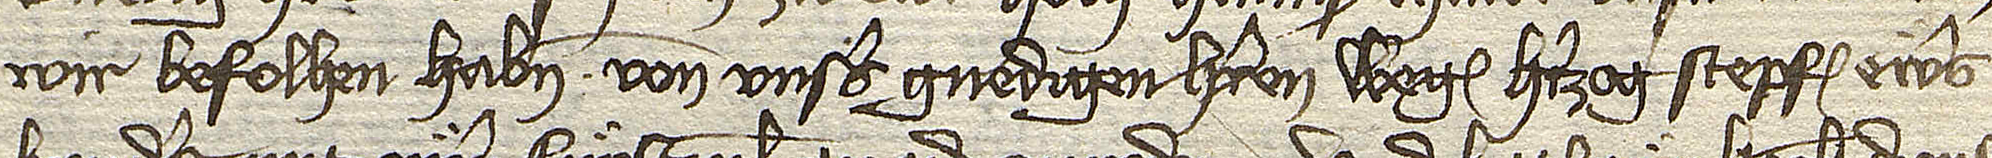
wir befolhen habn* . von vnſ*s gnedigen h*ren weg* h*cʒog ſtepf* eẅ*s
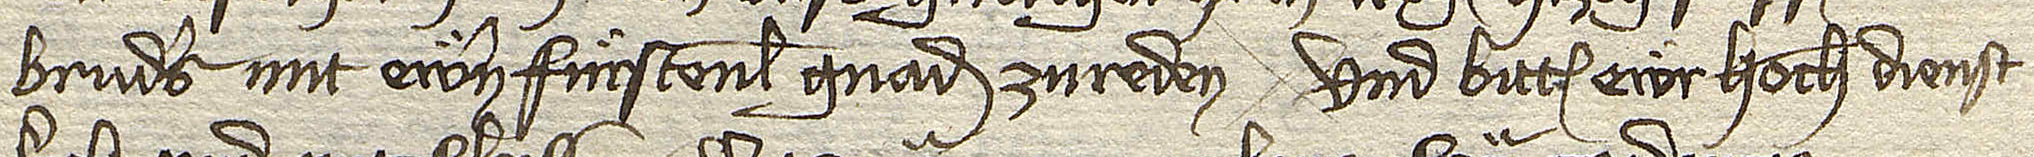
brud*s mit eẅ*n fürſtenl* gnad* ʒu reden / Vnd bitt* eẅr hoch* dienſt
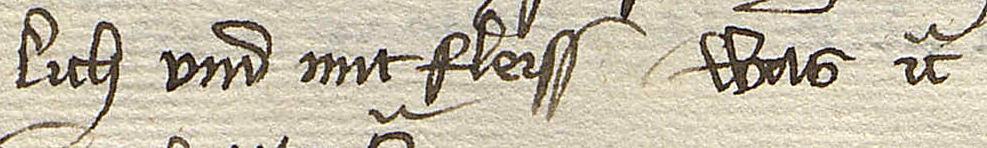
lich vnd mit fleiſſ / was ec*
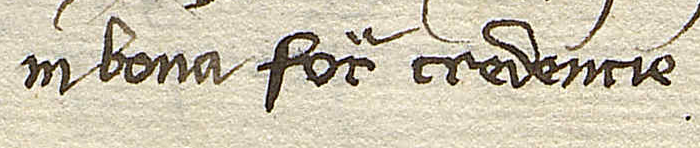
in bona for* credencie
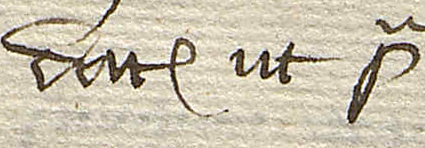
Dat* ut ſ*
